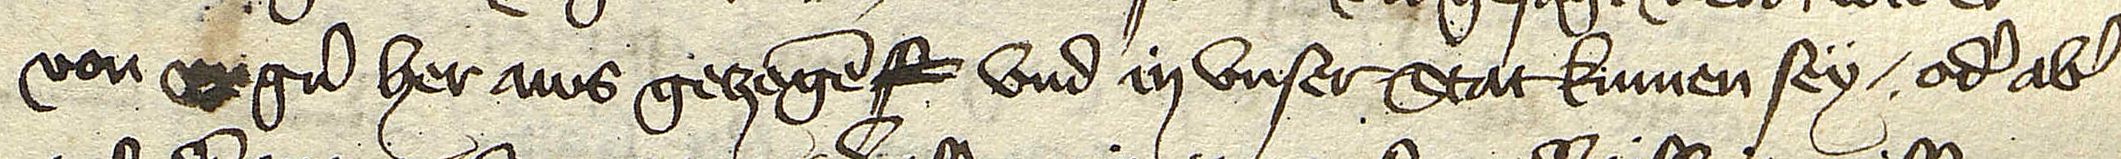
von vn gn* her aws gecʒoge* ſe vnd in vnſer Stat kumen ſey / . od* ab*
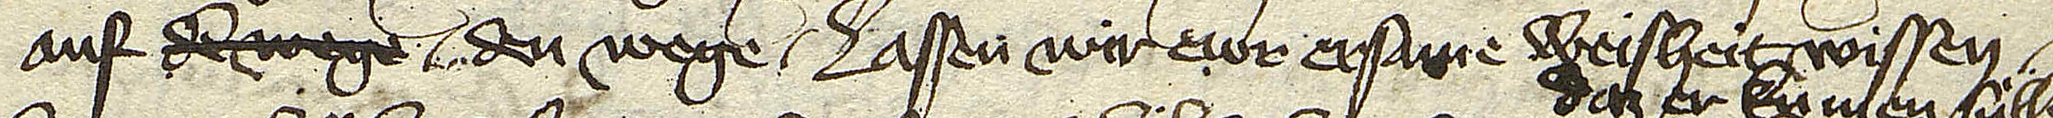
auf de* wege / den wege / Laſſen wir ewr erſame weiſheit wiſſen /
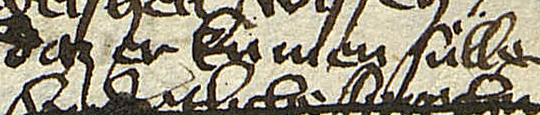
daʒ er kumen ſülle
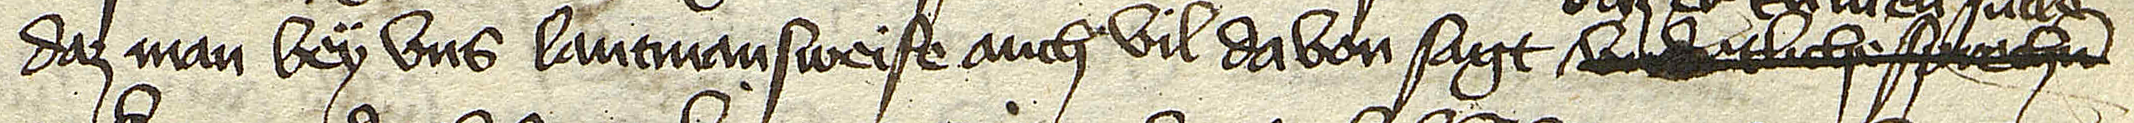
daʒ man bey vns lantmanſweiſe auch vil davon ſagt / vnd etliche ſprechn*
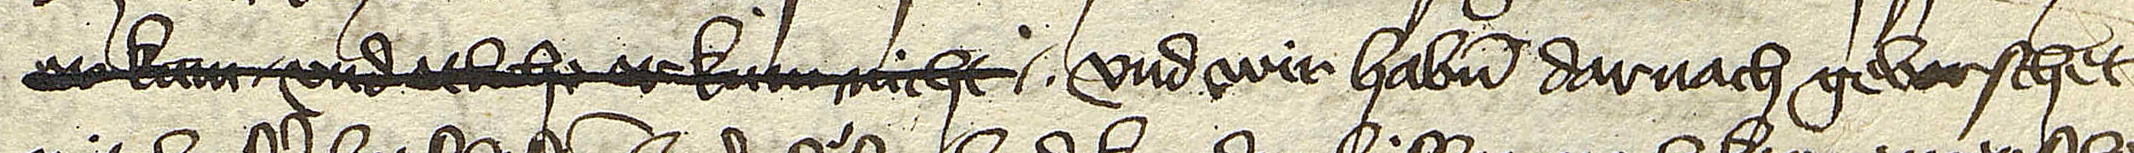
er kum / vns etliche er kum nicht /. vnd wir habn* darnach gevorſchet
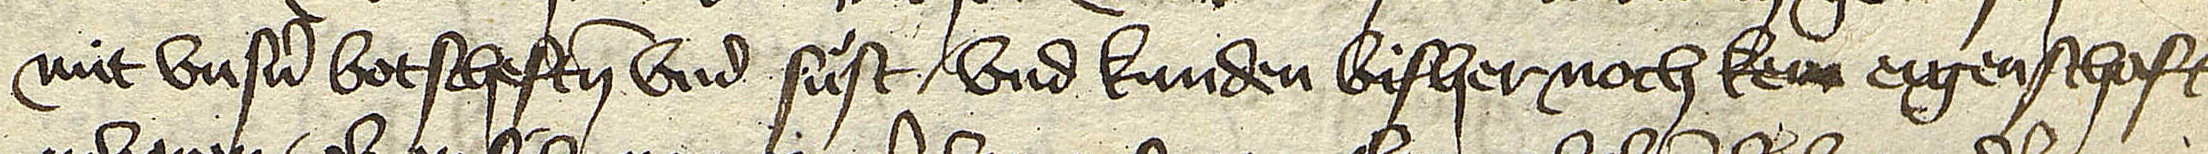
mit vnſn* botcheftn* vnd ſüſt / vnd kunden biſher noch kein eigenſchaft
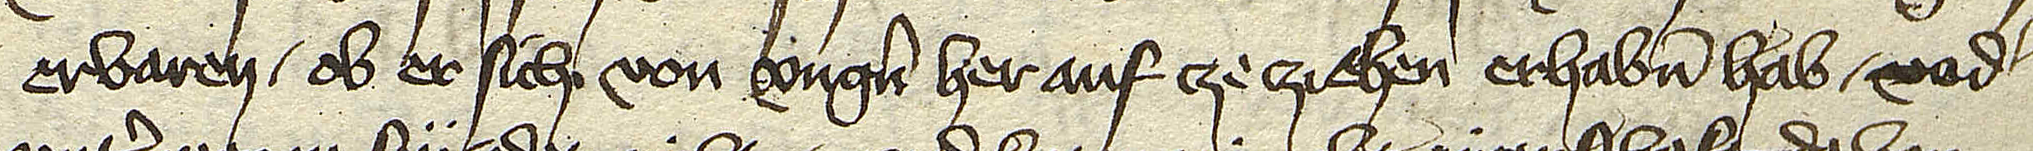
ervaren / ob er ſich von vngn* her auf cʒe cʒiehen erhabn* hab / vnd
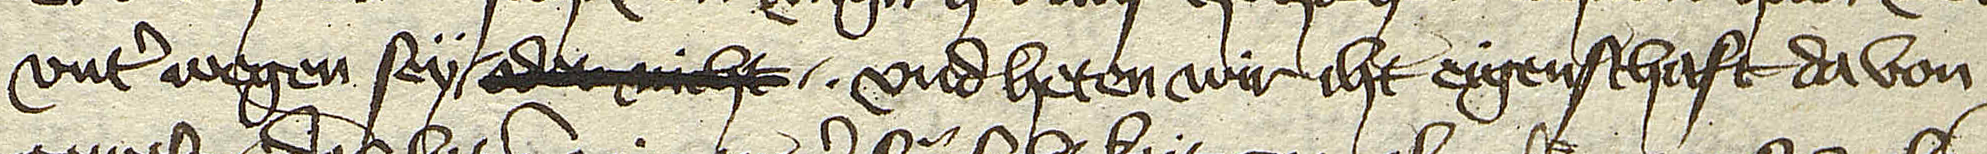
vnt* wegen ſey / oder nicht / . vnd heten wir iht eigenſchaft davon
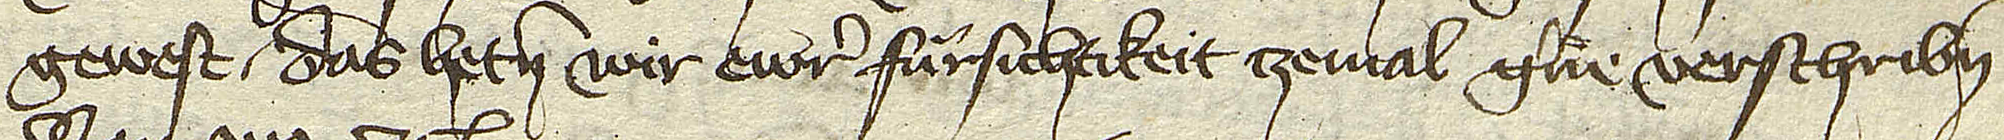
geweſt / Das hetn* wir ewr* fürſichtikeit cʒemal g*ne verſchribn*
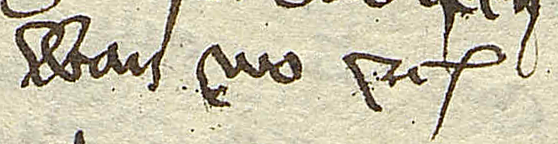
wan wo ec*
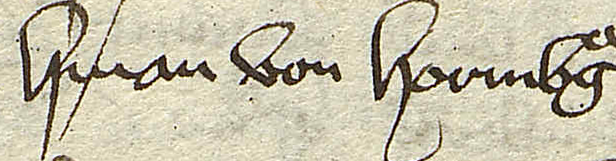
h*man von hormb*g
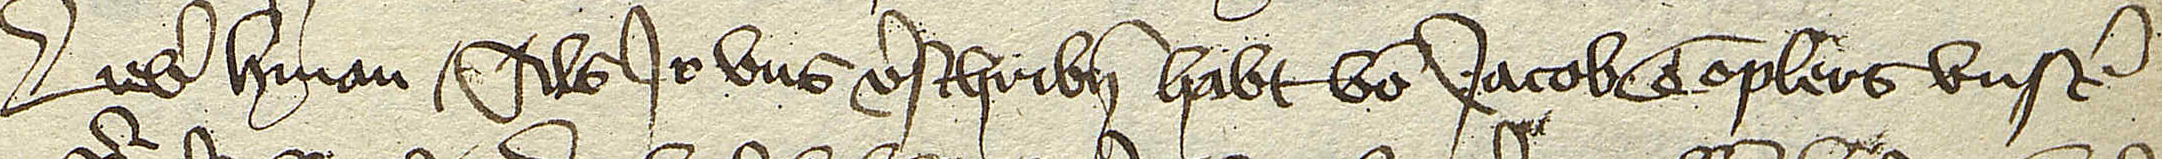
Lieb* h*man / Als Ir vns v*ſchribn* habt vo* Iacob Toplers vnſs*
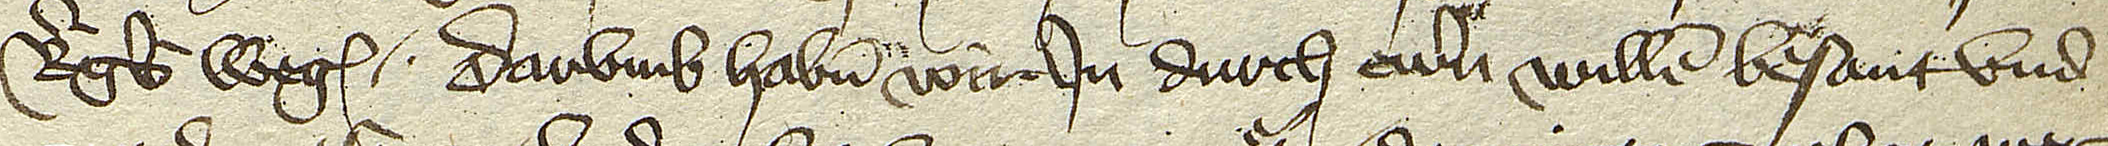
B*g*s weg* / . Darvmb habn* wir In durch ew*n wille* beſant vnd
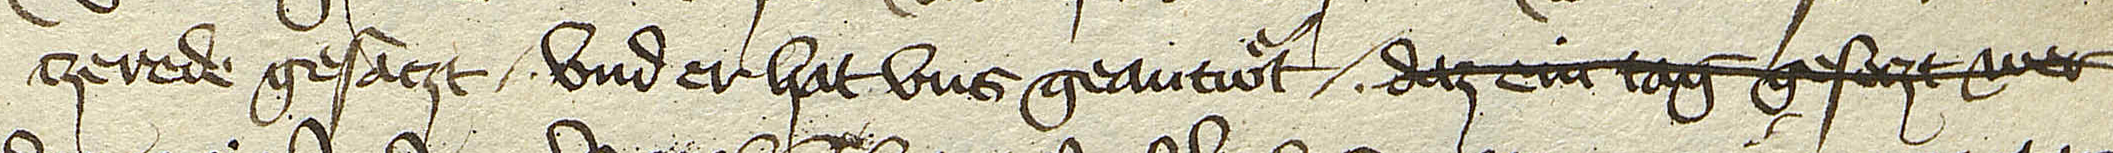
cʒerede geſacʒt / . vnd er hat vns geantw*t / . daʒ ein tag geſecʒt wer
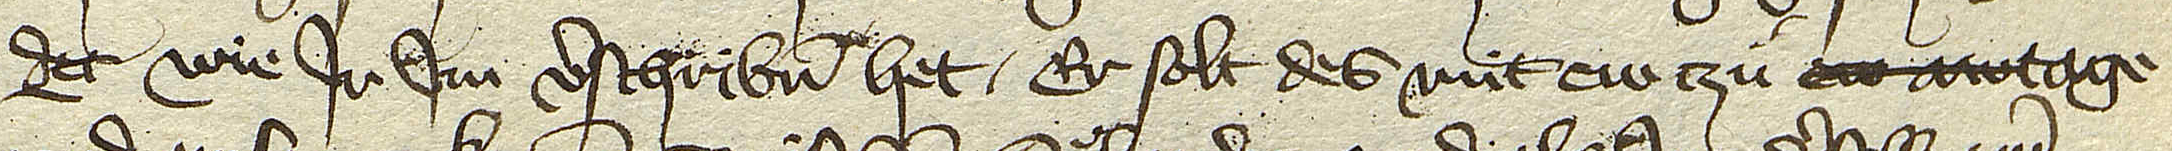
der wie Ir Im v*ſchribn* het / Er ſolt des mit ew cʒü ew awtage
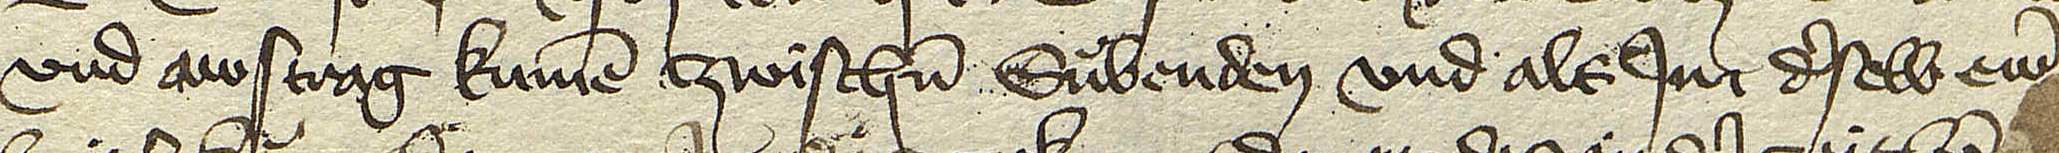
vnd awſtrag kume* cʒwiſchn* Sübenden vnd als Im d*ſelb ew*
